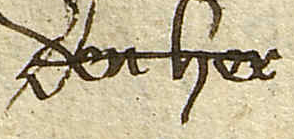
Den her
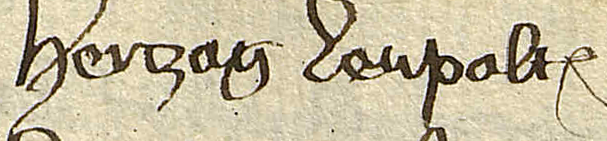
hercʒog Leupolt*
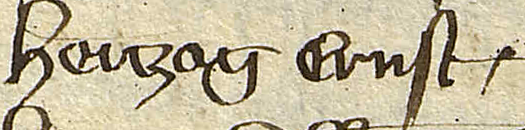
hercʒog Ernſt*
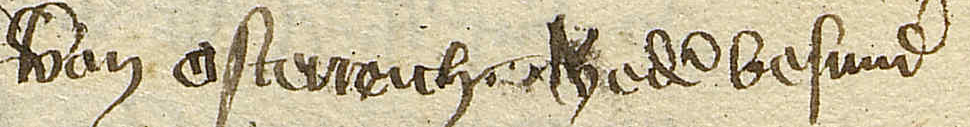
von Oſterreich yed* beſund*
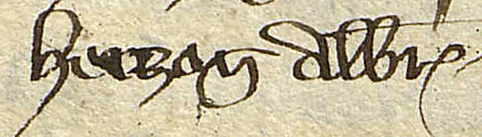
hercʒog Albr*
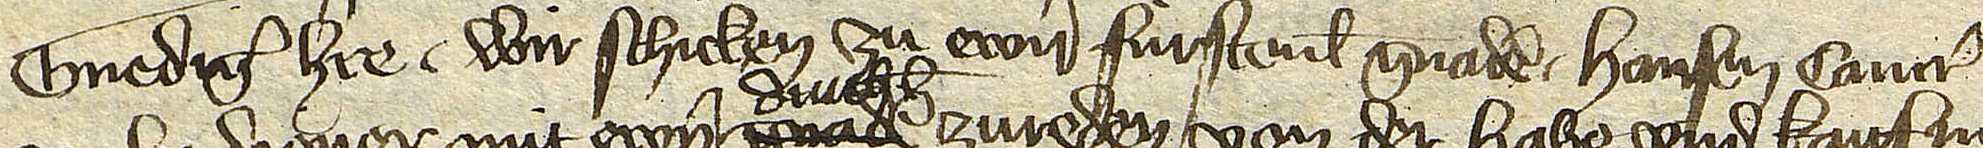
Gnedig* h*re / wir ſchicken cʒu ewn* fürſtenl* gnade* / hanſen Camr*
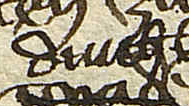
durchl*
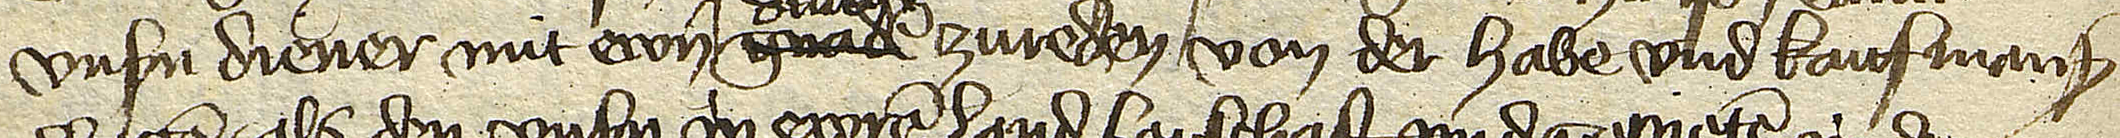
vnſ*n diener mit ewn* gnad* cʒureden von der habe vnd kaufmanſ*
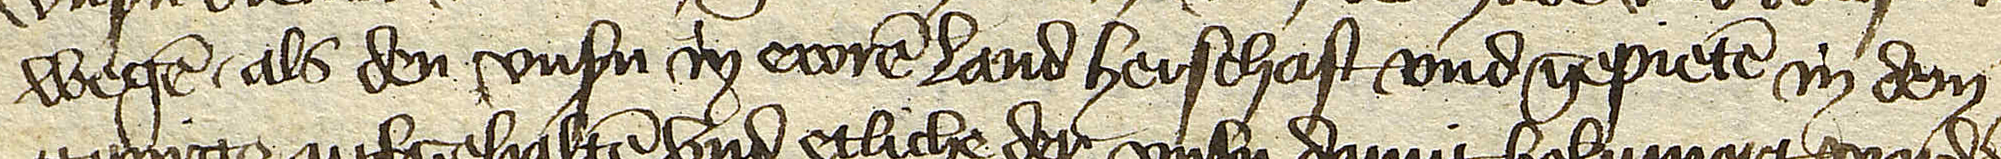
wege* / als den vnſ*n in ewre* land herſchaft vnd gepiete* in dem
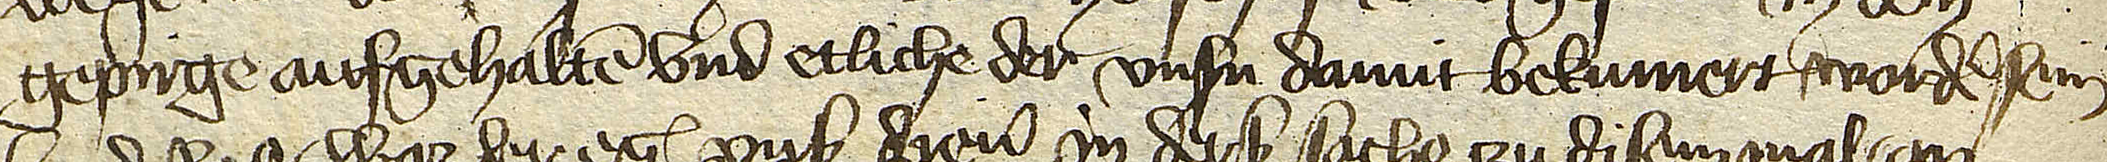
gepirge aufgehalte* vnd etliche der vnſ*n damit bekumert word* ſein
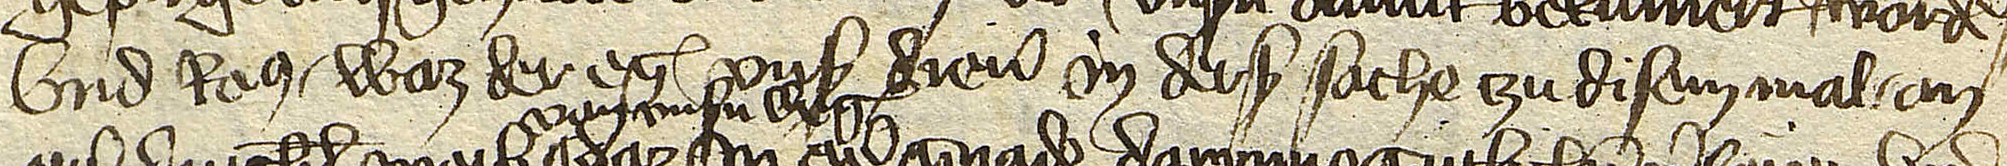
vnd Ro* / waʒ der eg* vnſ* dien* in derſ* ſache cʒu diſem mal / an
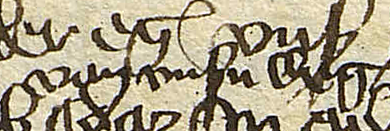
von vnſ*n weg*
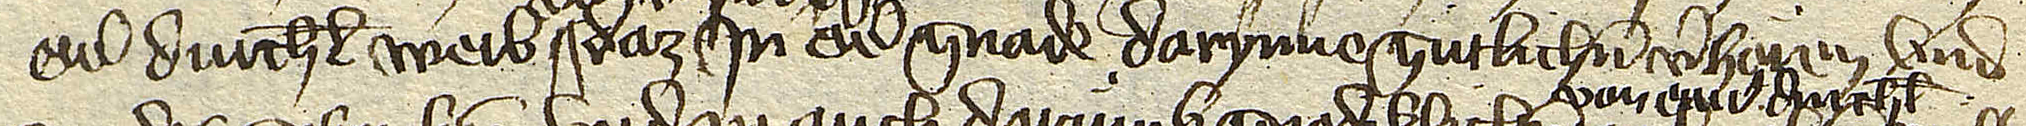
ew* durchl* werb / daʒ In ew* gnade darynne gutlichn* v*hören vnd
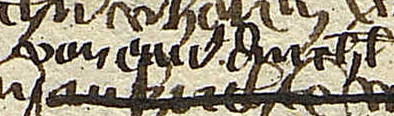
von ewn* durchl*
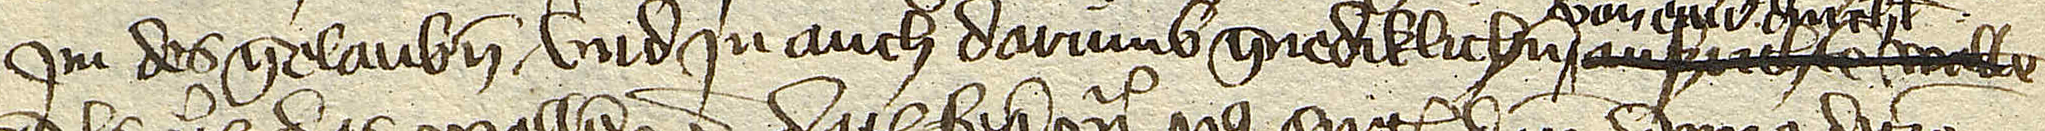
Im des gelaubn* / vnd In auch darümb gnediklichn* auſʒrichte* wölle
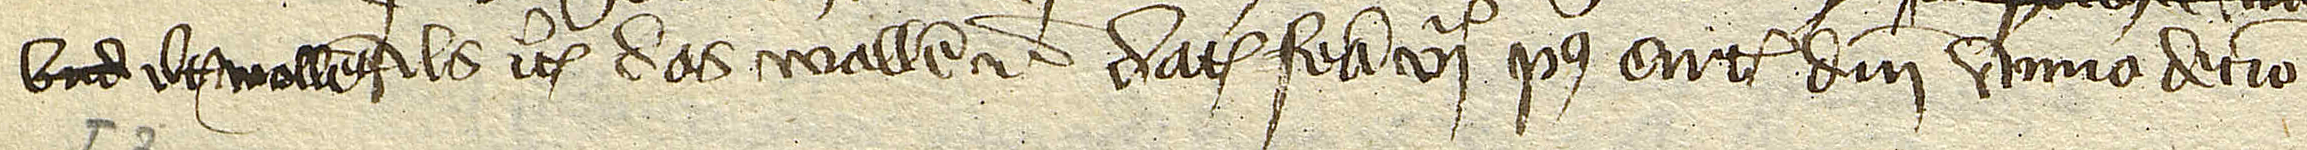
vnd v*t* wollen Als ec* das wolle* ec* dat* fea* p* Crt* dm* Anno decio*
